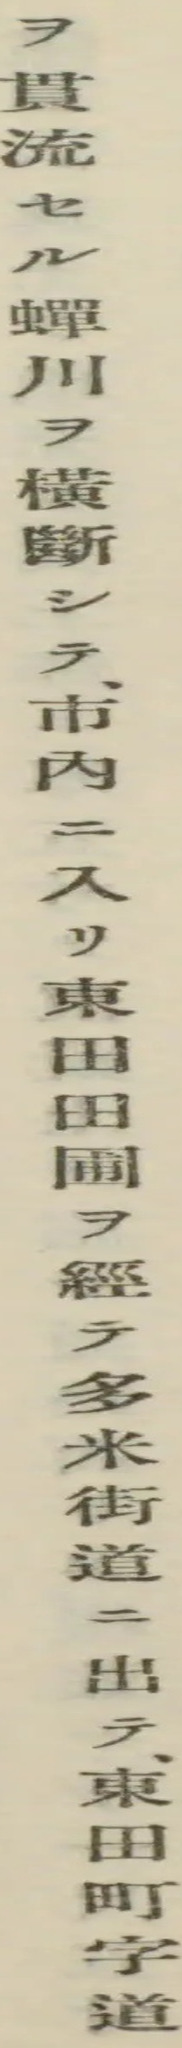を貫流せる蝉川を横断して、市内に入り東田田圃を経て多米街道に出て、東田町字道
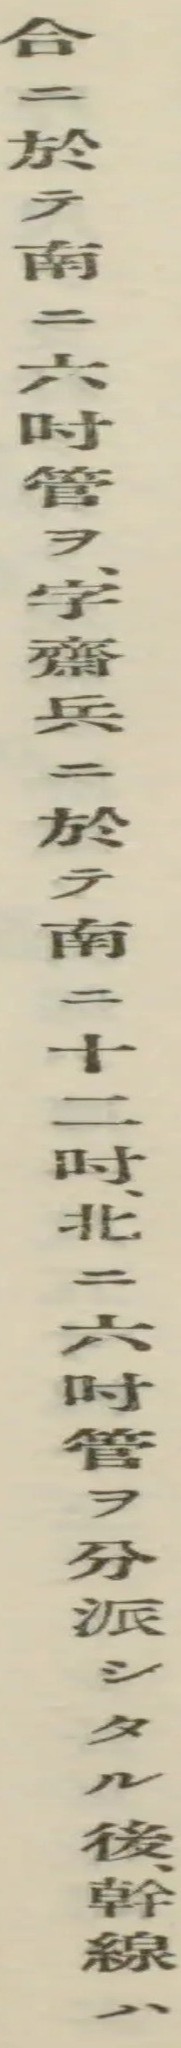合に於て南に六吋管を、字齋兵に於て南に十二吋、北に六吋管を分派したる後、幹線は
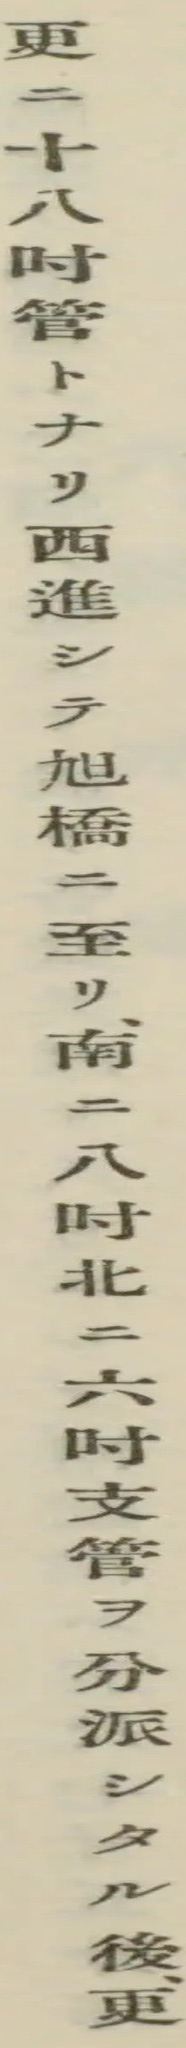更に十八吋管となり西進して旭橋に至り、南に八吋北に六吋支管を分派したる後、更
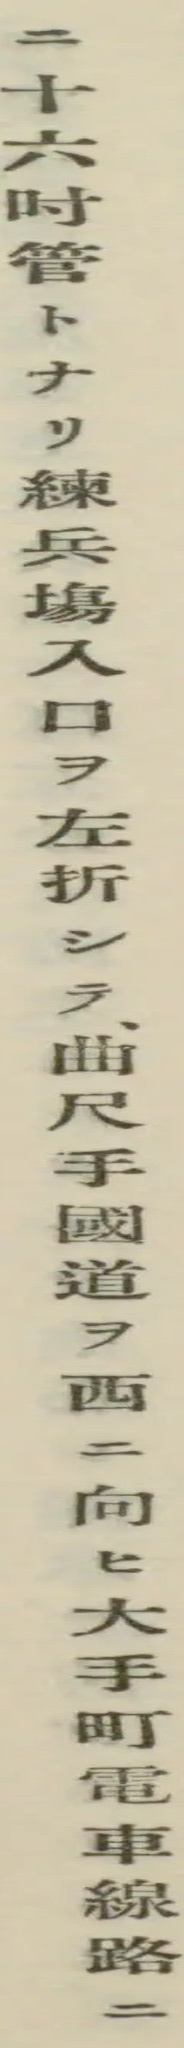に十六吋管となり練兵場入口を左折して、曲尺手国道を西に向ひ大手町電車線路に
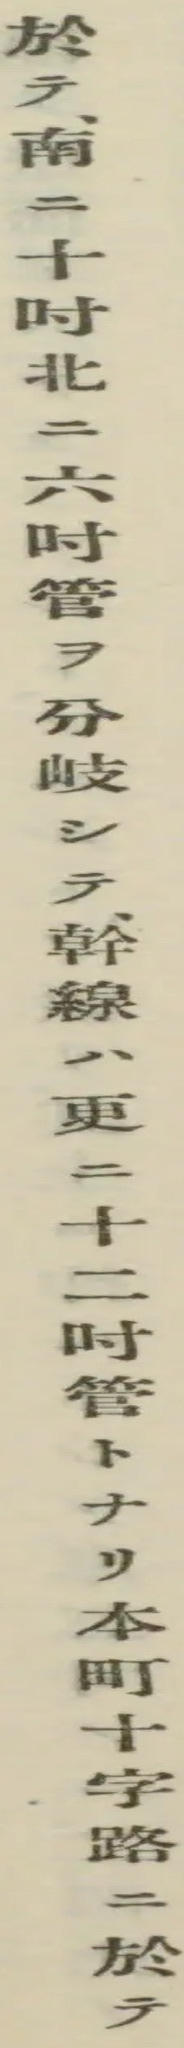於て、南に十吋北に六吋管を分岐して、幹線は更に十二吋管となり本町十字路に於て
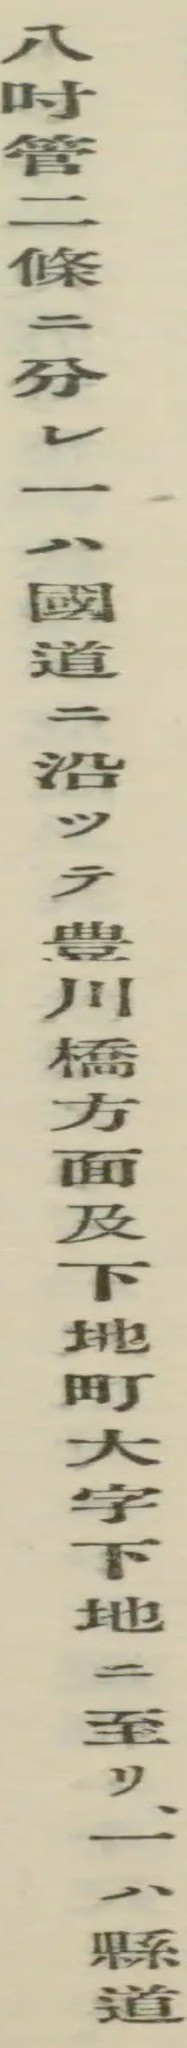八吋管二條に分れ一は国道に沿つて豊川橋方面及下地町大字下地に至り、一は縣道
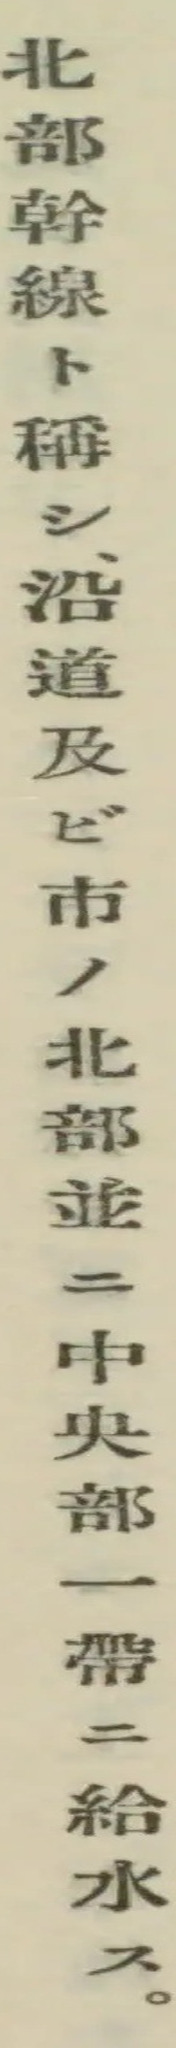北部幹線と稱し、沿道お及び市の北部並に中央部一帯に給水す。
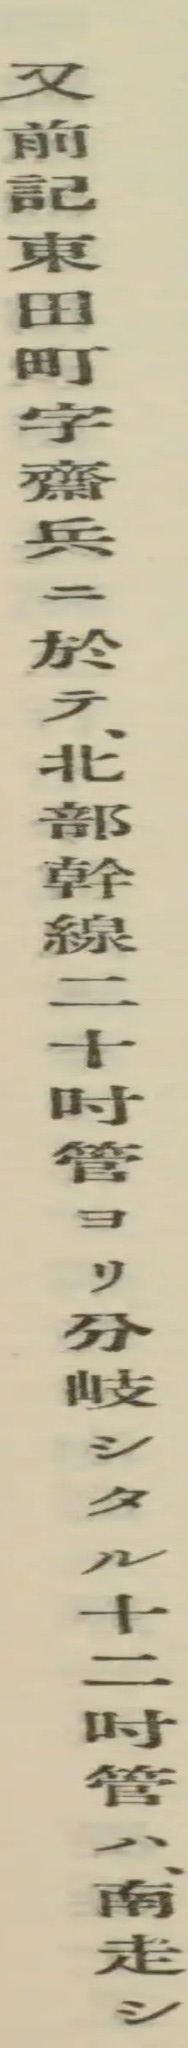前記東田町字齋兵に於て、北部幹線二十吋管より分岐したる十二吋管は、南走し
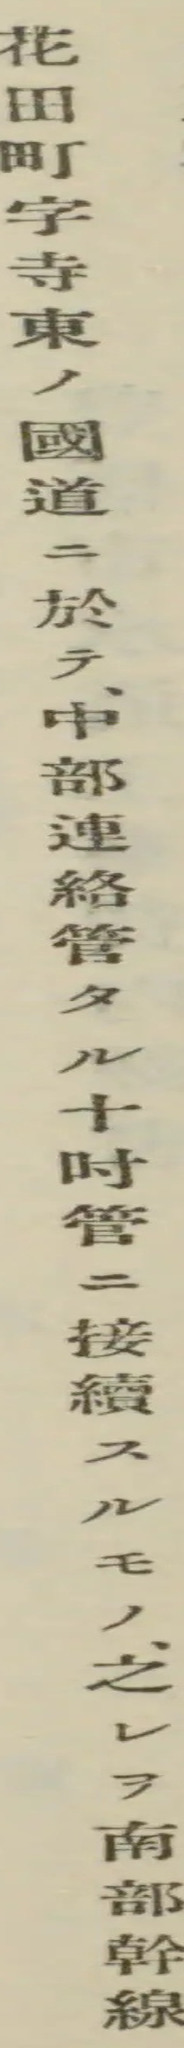花田町字寺東の国道に於て、中部連絡管たる十吋管に接続するもの、之れを南部幹線
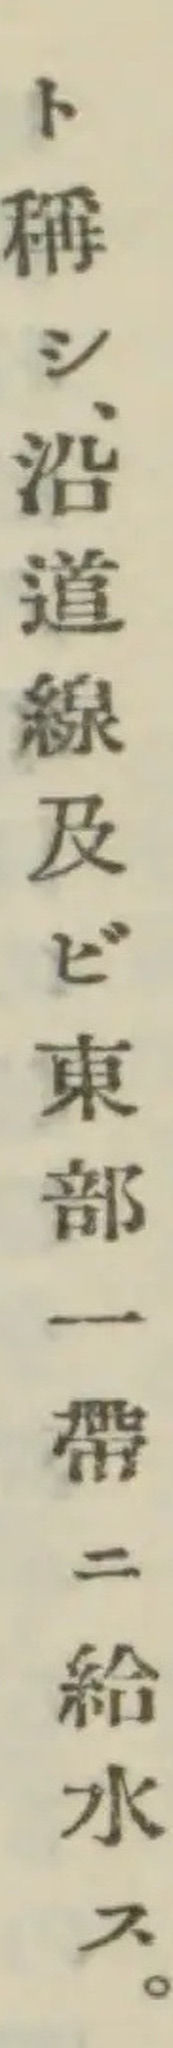と稱し、沿道線及び東部一帯に給水す。
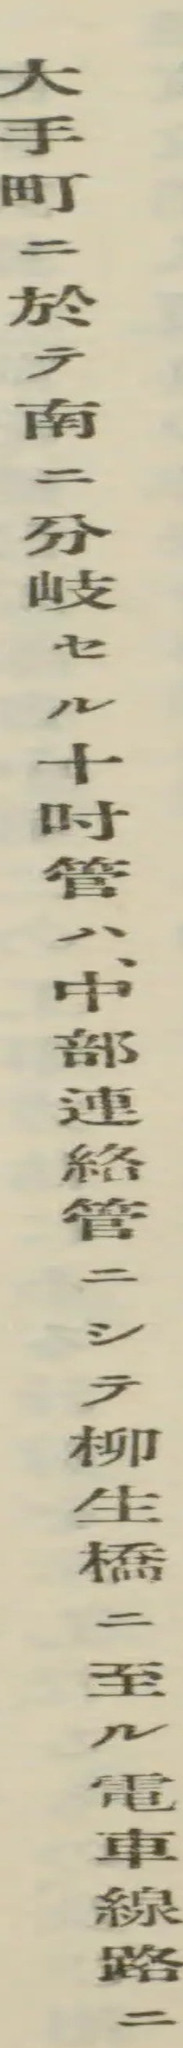大手町に於て南に分岐せる十吋管は、中部連絡管にして柳生橋に至る電車線路に
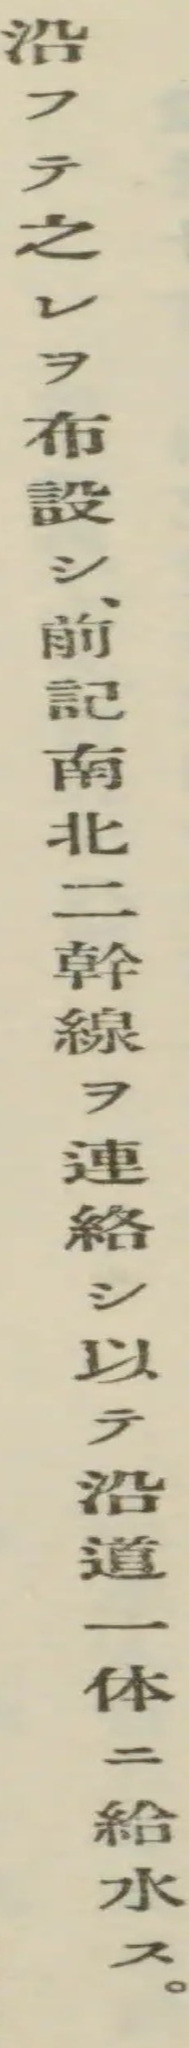沿ふて之れを布設し、前記南北二幹線を連絡し以て沿道一体に給水す。
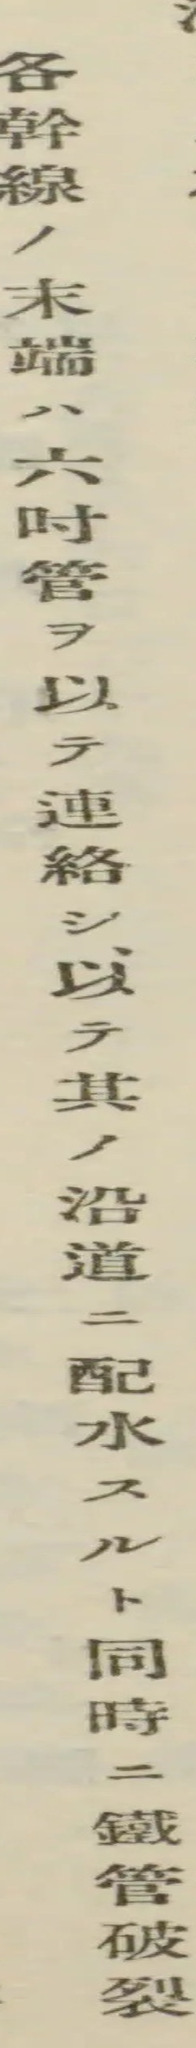各幹線の末端は六吋管を以て連絡し、以て其の沿道に配水すると同時に鉄管は破裂
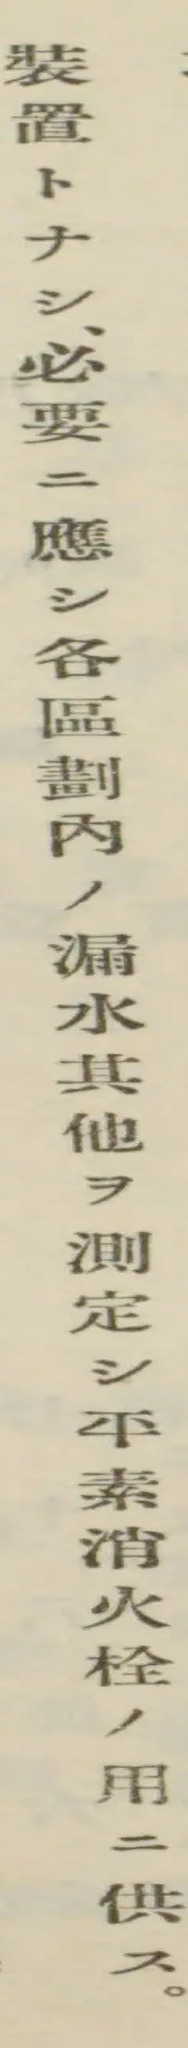装置となり、必要に応し各区画内の漏水其他を測定し平素消火栓の用に供す。
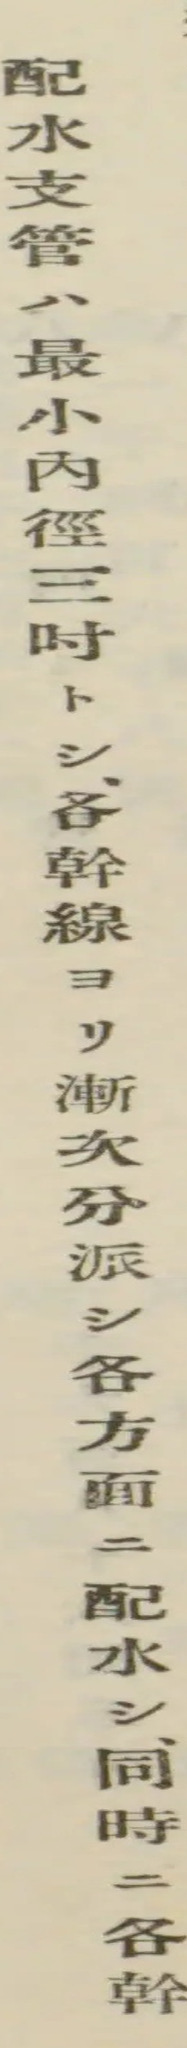配水支管は最小内径三吋とし、各幹線より漸次分派し各方面に配水し、同時に各幹
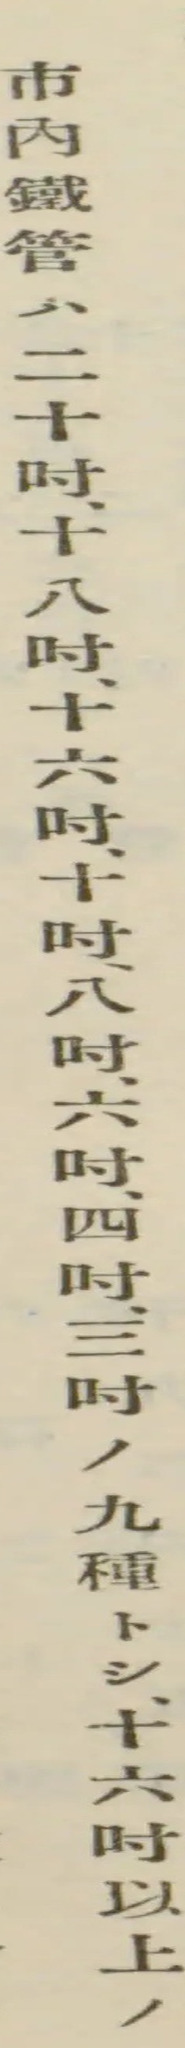市内鉄管は二十吋、十八吋、十六吋、十吋、八吋、六吋、四吋、三吋の九種とし、十六吋以上の
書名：豊橋市水道誌
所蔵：国立国会図書館 National Diet Library, JAPAN
